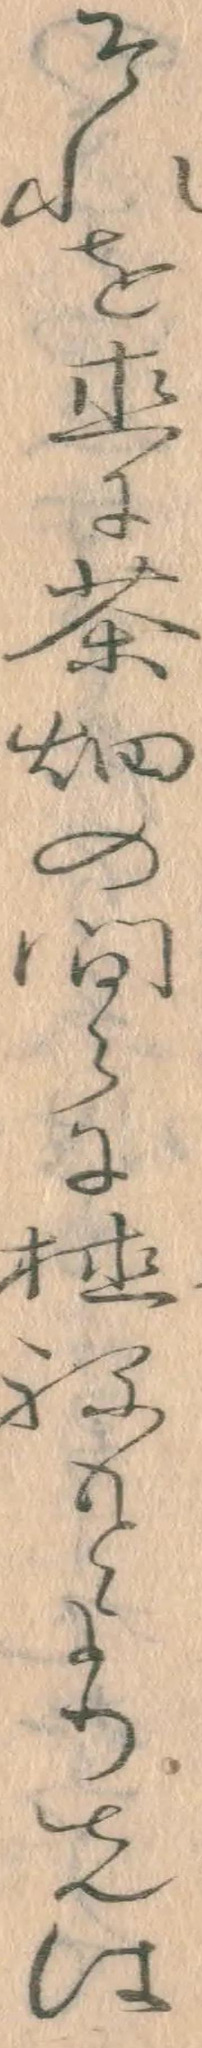それを直に茶畑の間々に植ねもとより先は
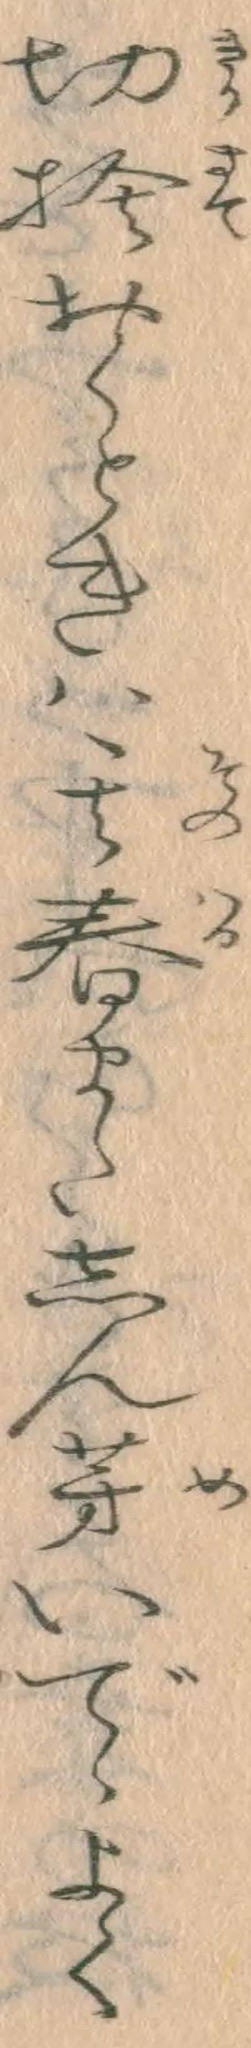切捨おくときは其春またしん芽いでゝよく
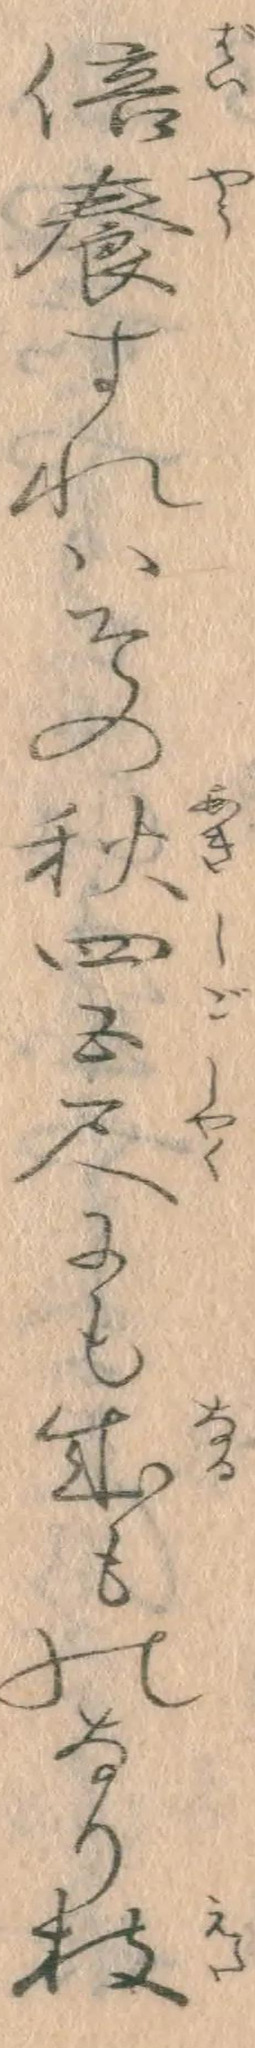培養すれはその秋四五尺にも成ものなり枝
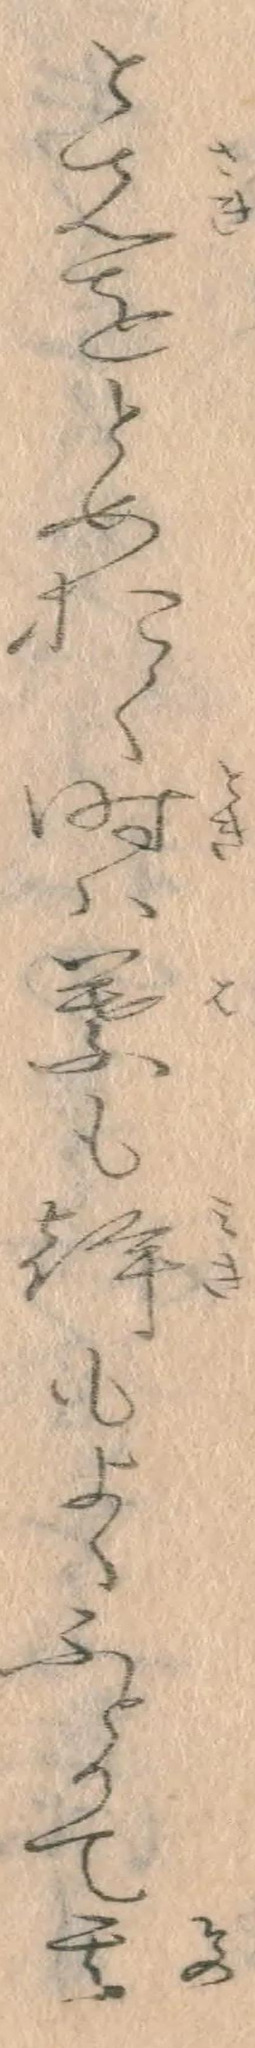と先をとめおく時は葉も幹もよくふとりて其
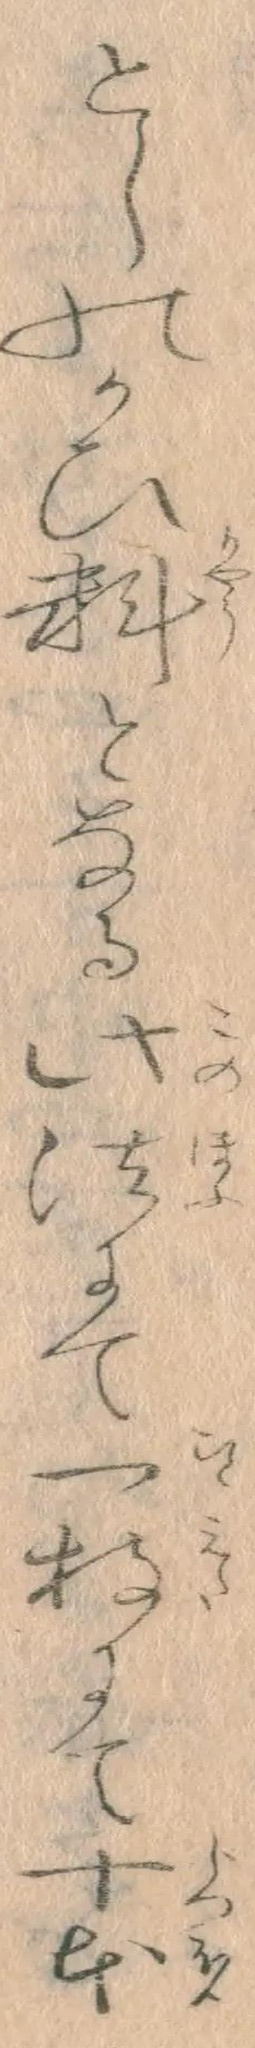としのかひ料となる此法にて一枝にて十本
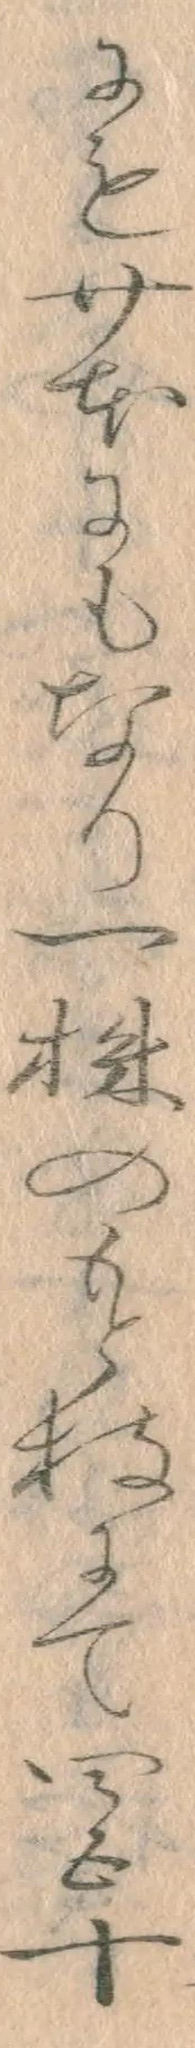にも廿本にもなり一株のもと枝にて四五十
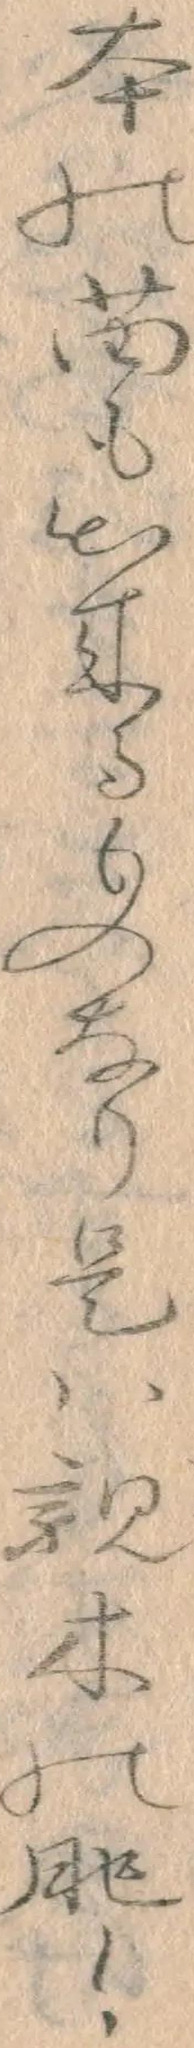本の苗も出来るものなり是は親木の肥し
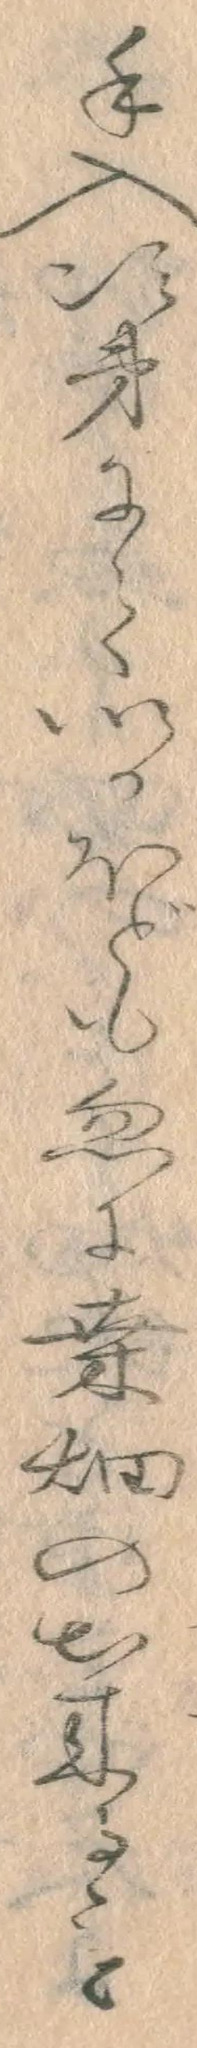手入次第にていかほども忽に桑畑の出来ること
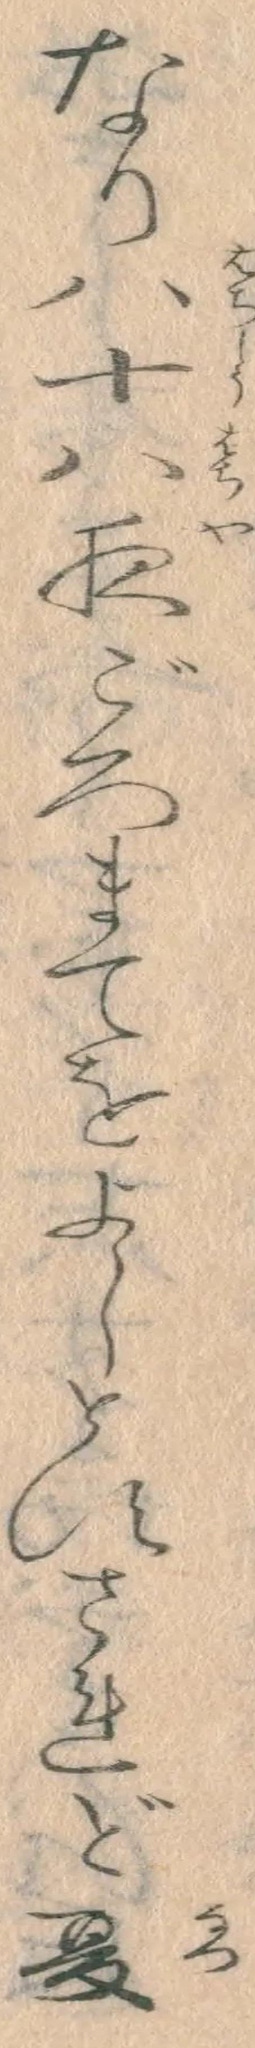なり八十八夜ごろまてをよしとすされど夏
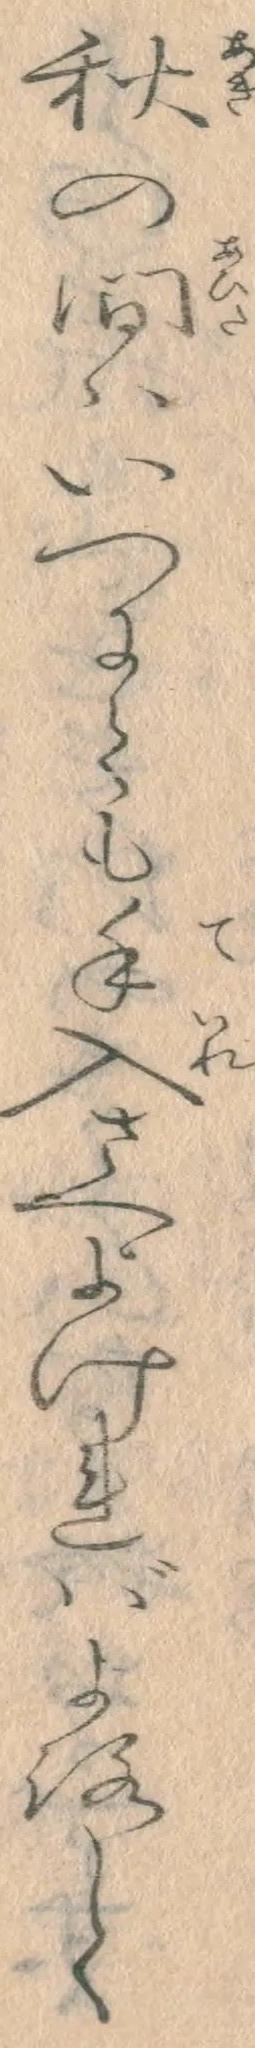秋の間はいつにても手入さへよければよろしく
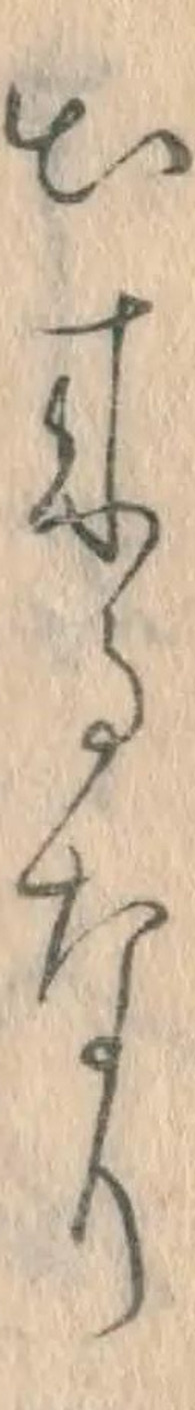出来るなり

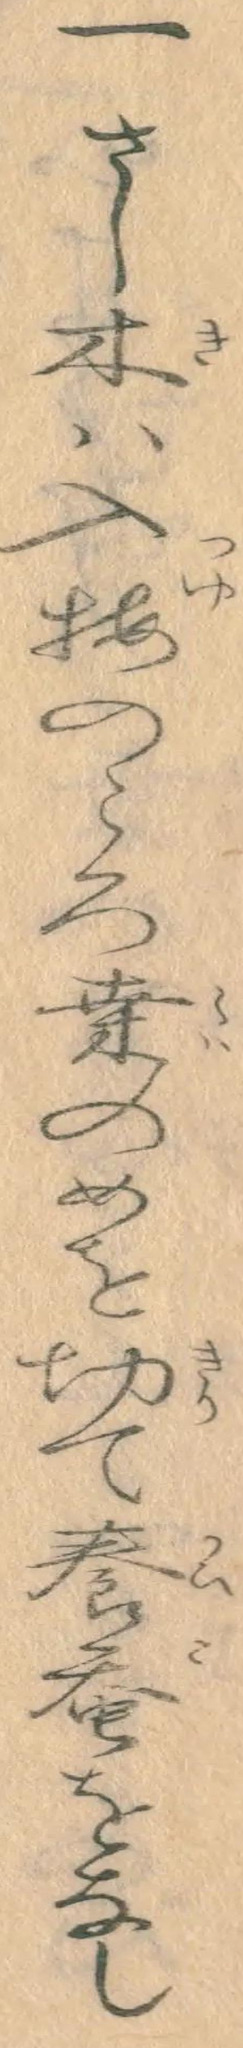一さし木は入梅のころ桑のめを切て養蚕なし
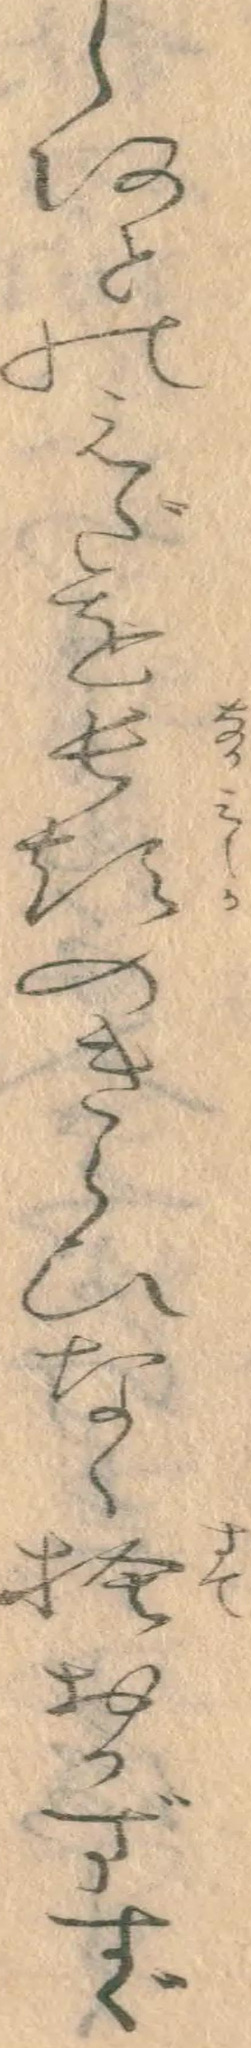しあとのえだを長短のきらひなく捨おかずすぐ
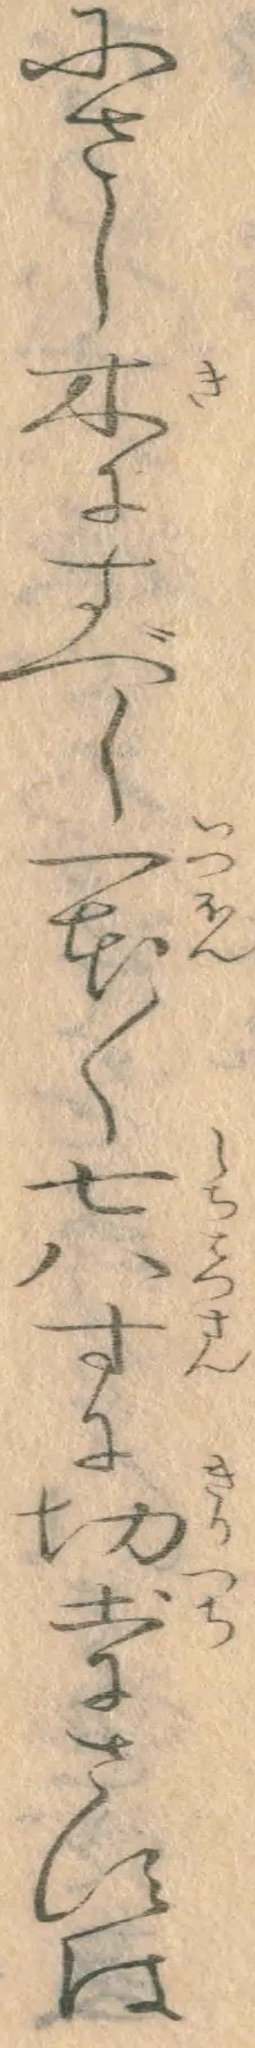にさし木にすべし一本〳〵七八寸に切土にさすは
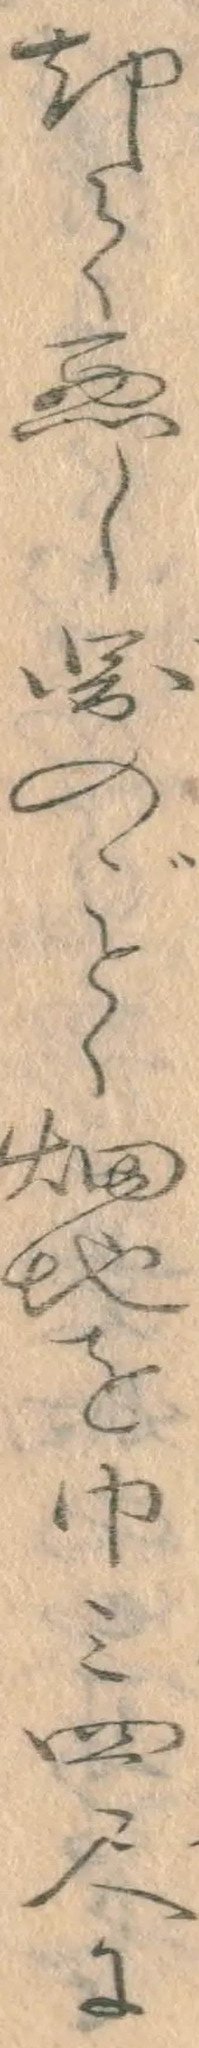却て悪し図のごとく畑地を巾三四尺に
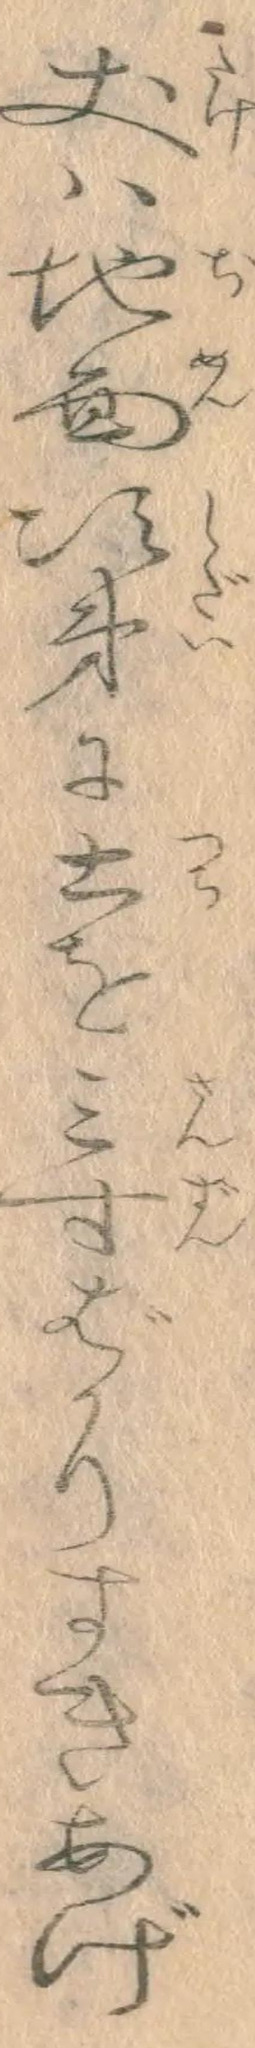丈は地面次第に土を三寸ばかりすきあげ
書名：蚕茶并紙木植方書
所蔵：国立国会図書館 National Diet Library, JAPAN
